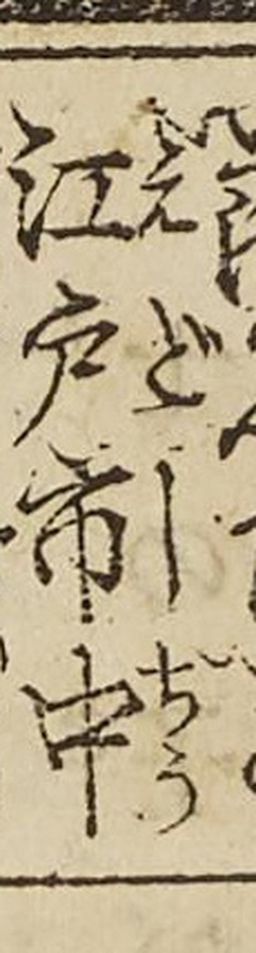江戸市中
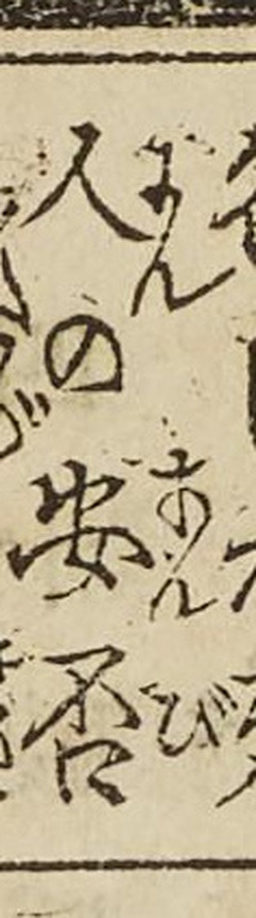人の安否
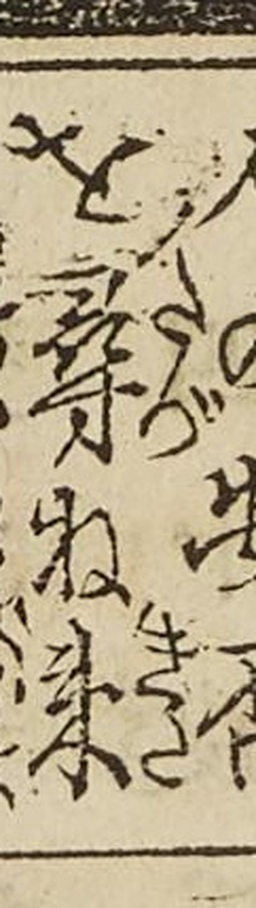を尋ね来
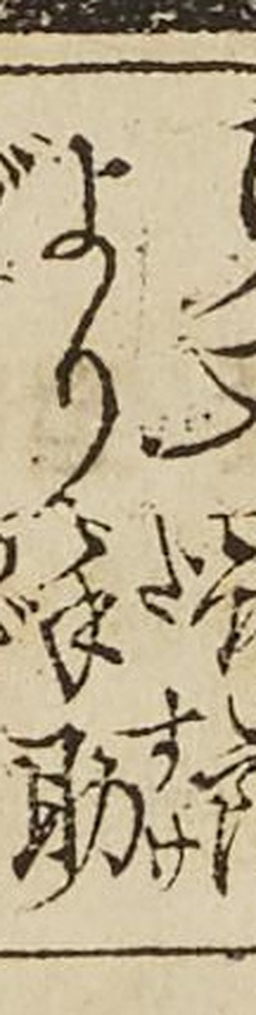より手助
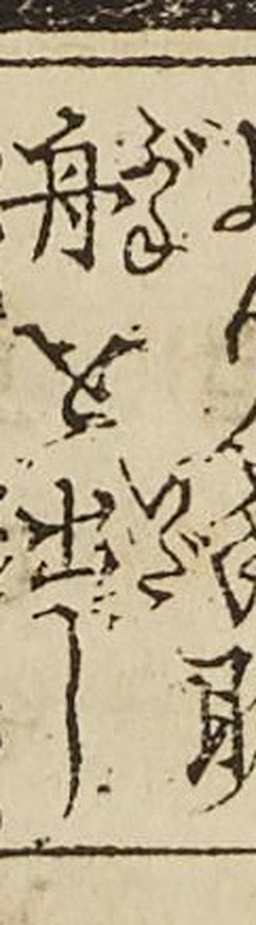舟を出し
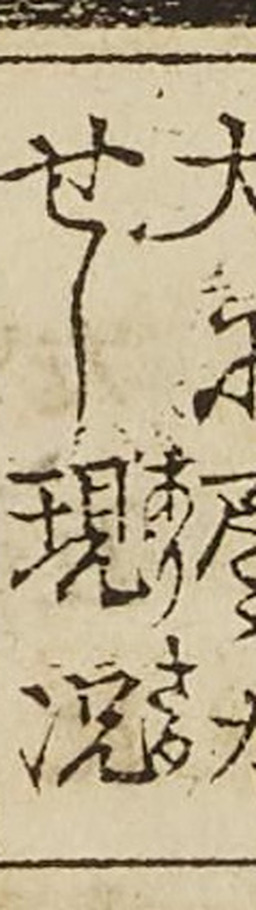せし現況

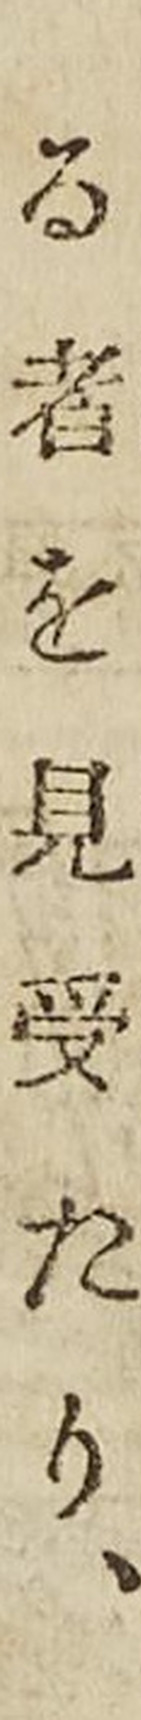る者を見受たり、
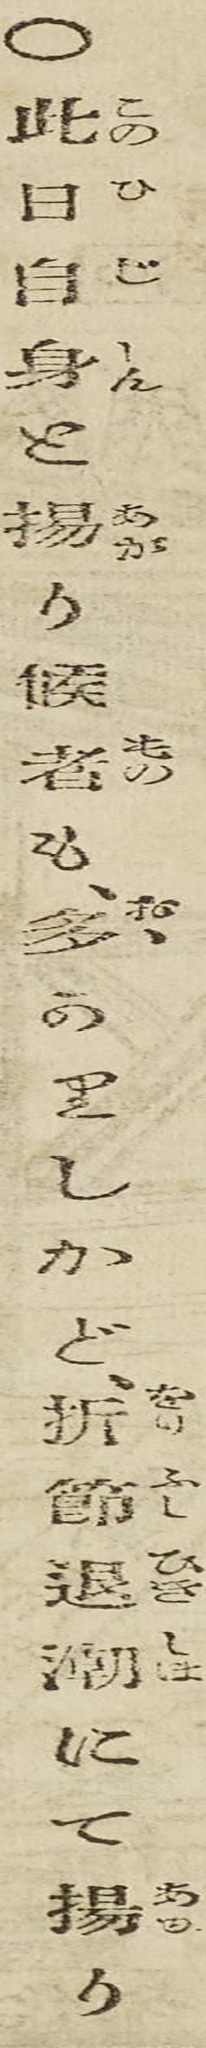○此日自身と揚り候者も、多かりしかど、折節退潮にて揚り
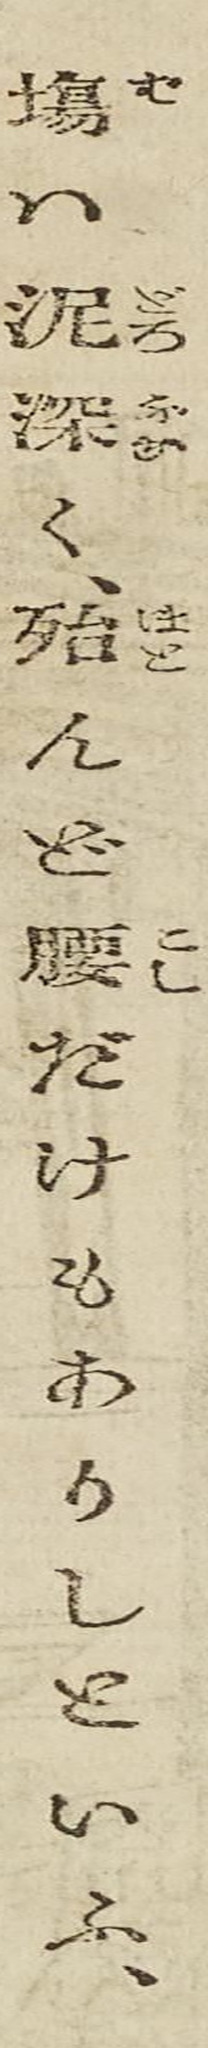場は泥深く、殆んど腰だけもありしといふ、
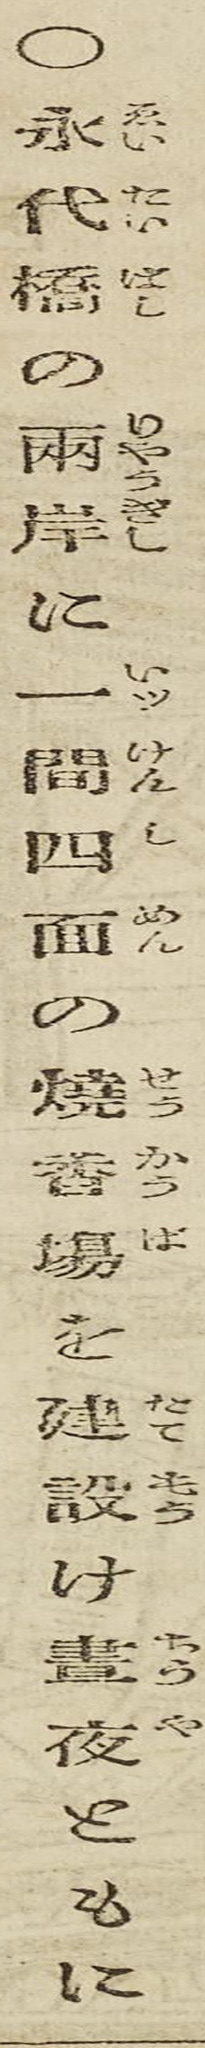○永代橋の両岸に一間四面の焼香場を建設け昼夜ともに
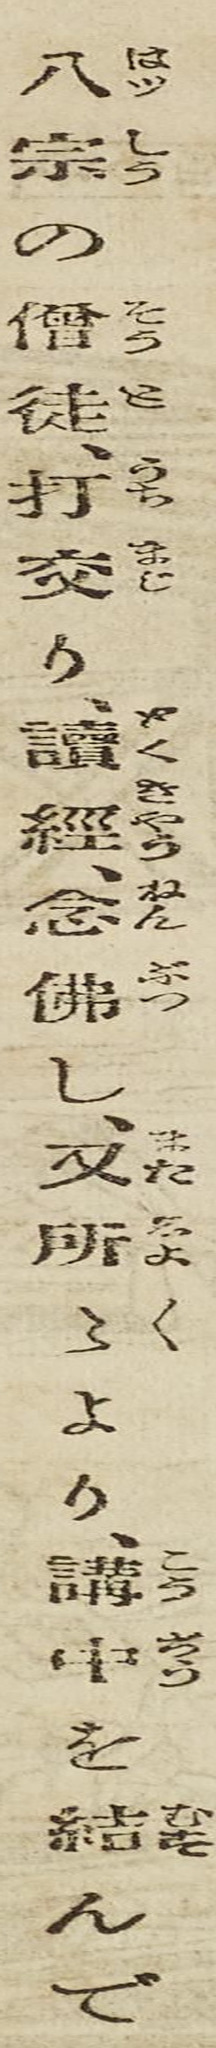八宗の僧徒、打交り、読経、念仏し、又所〻より、請中を結んで
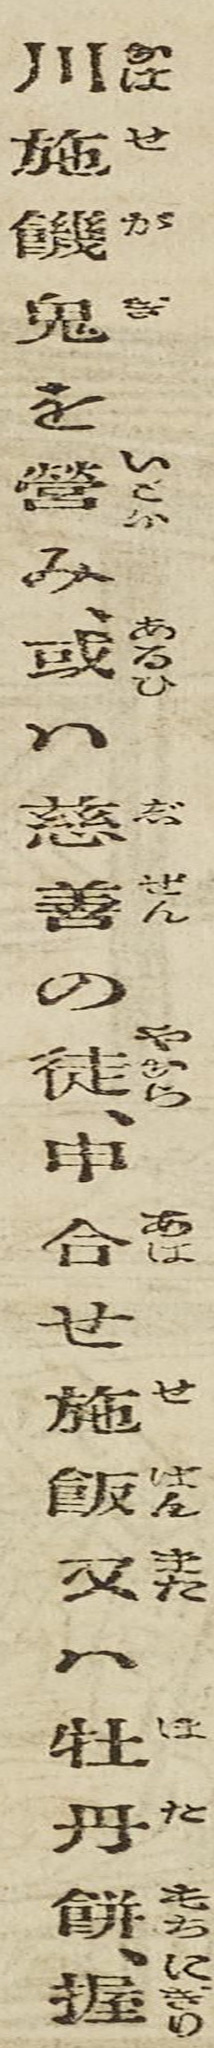川施餓鬼を営み、或は慈善の徒、申合せ施飯又は牡丹餅、握
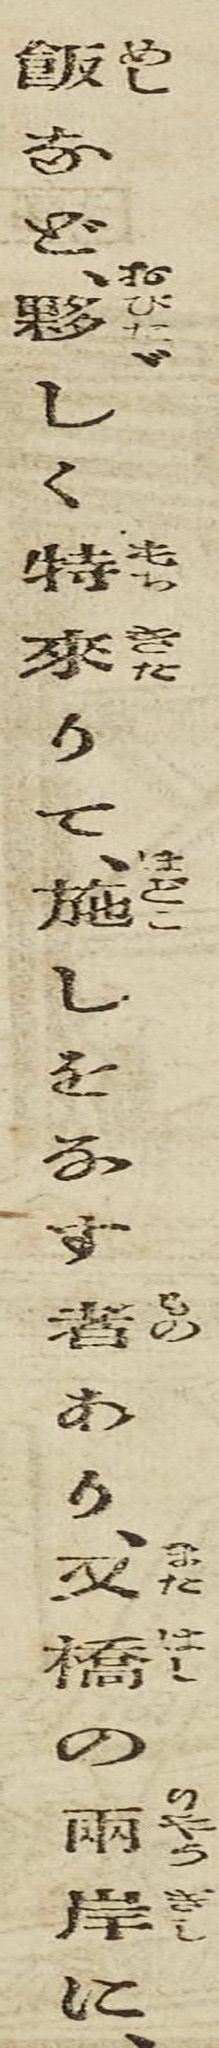飯など、夥しく持来りて、施しをなす者あり、又橋の両岸に、
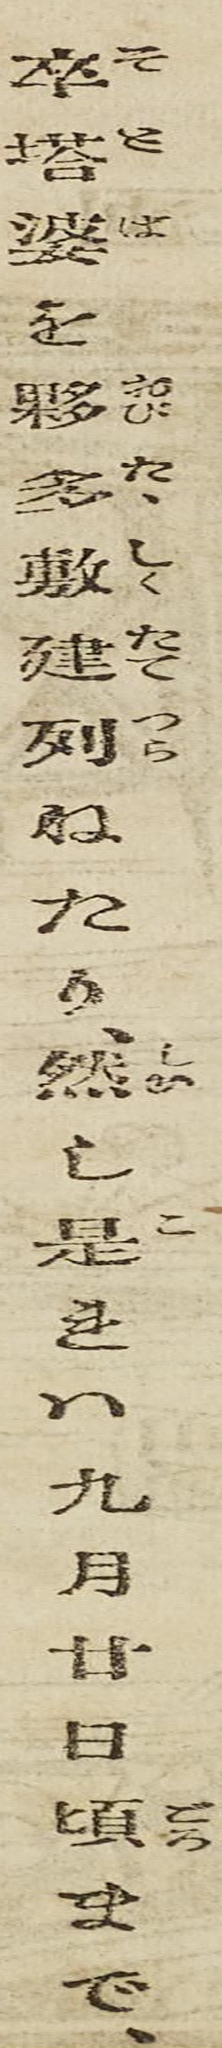卒塔婆を夥多敷建列ねたり、然し是れは九月廿日頃まで、
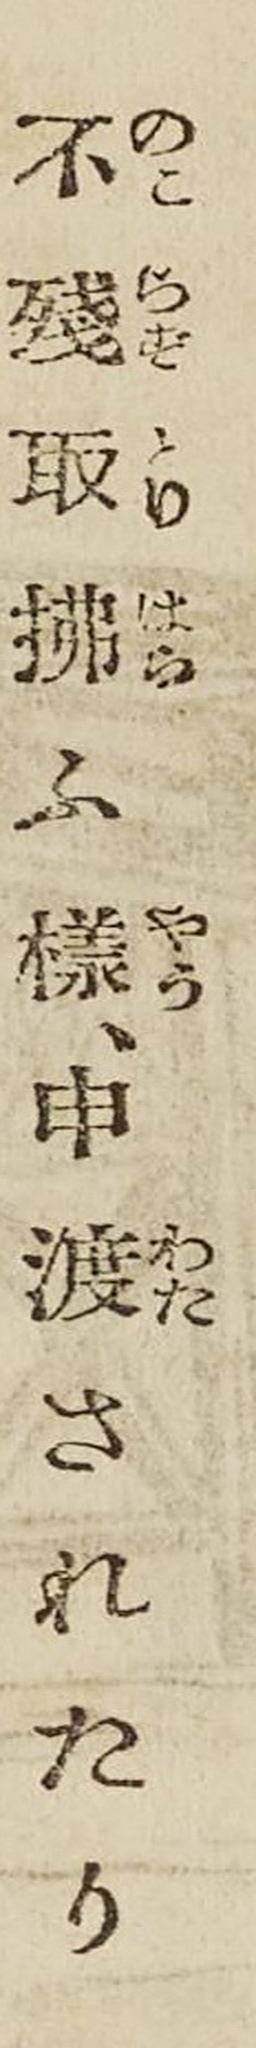不残取払ふ様、申渡されたり
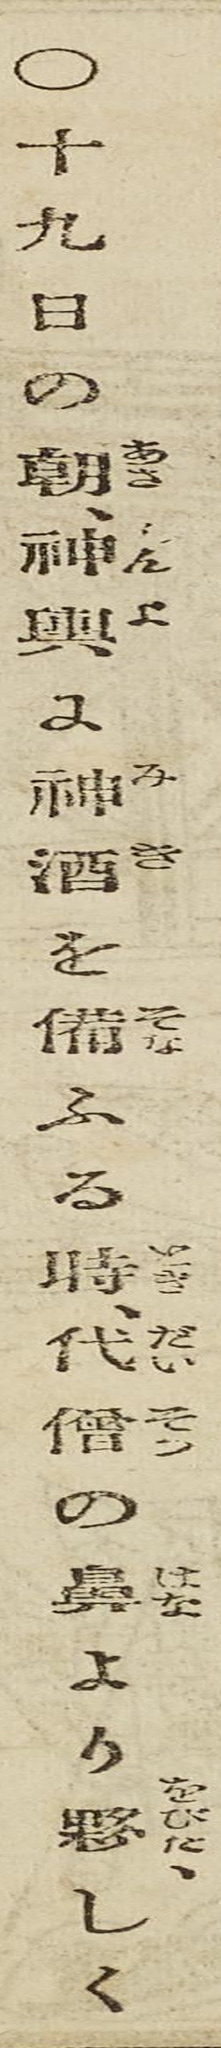○十九日の朝、神輿に神酒を備ふる時、代僧の鼻より夥しく
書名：永代惨話　文化の夢　全
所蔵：東京大学地震研究所図書室 Earthquake Research Institute Library, The University of Tokyo, JAPAN
